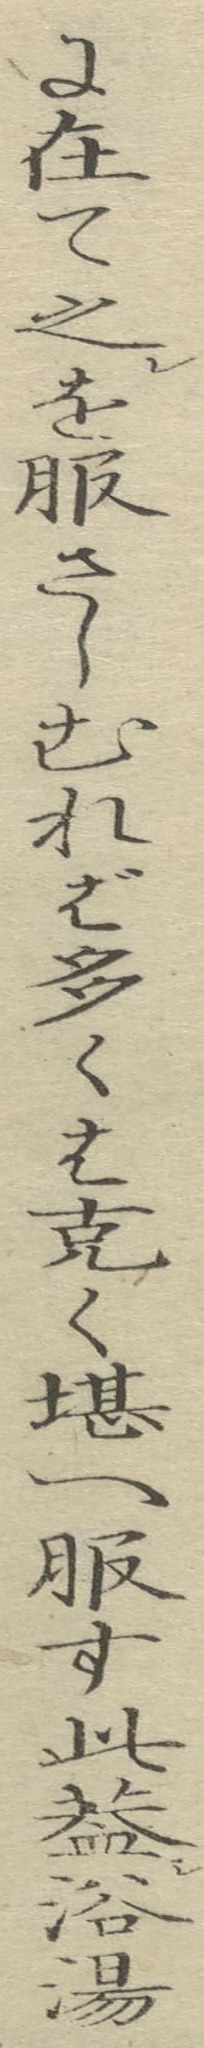に在て之服さしむれば多くは克く堪へ服す此益浴場
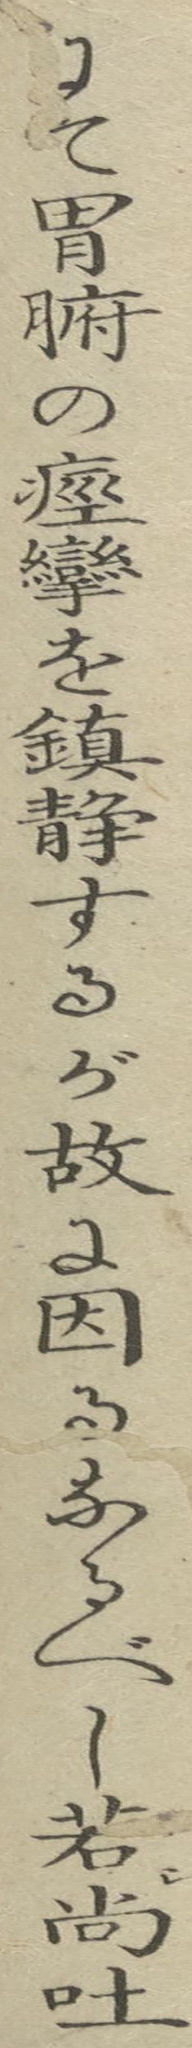にて胃腑の痙攣を鎮静するが故に因るなるべし若尚吐
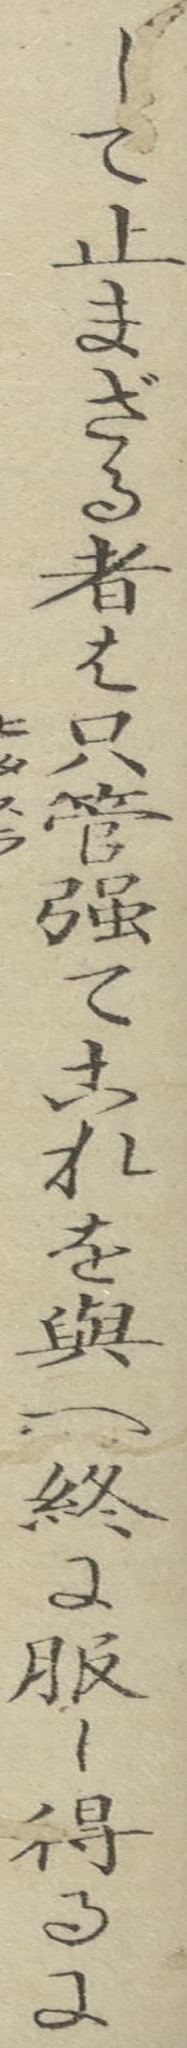して止まざる者は只管強てこれを與へ終に服し得るに
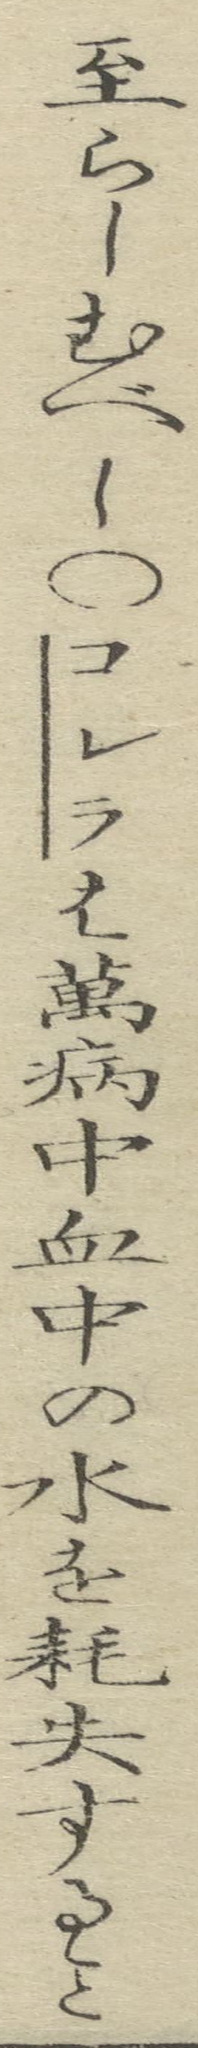至らしむべし〇コレラは萬病中血中の水を耗失すること
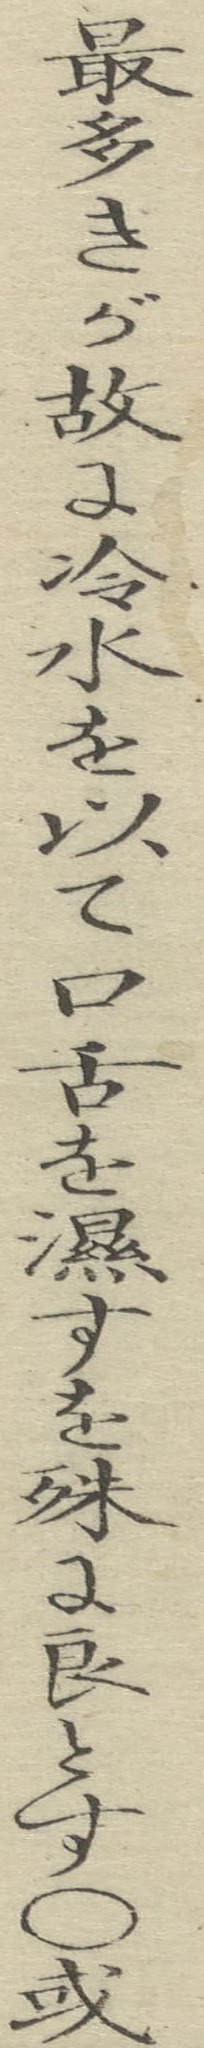最多きが故に冷水を以て口舌を濕すを殊に良とす〇或
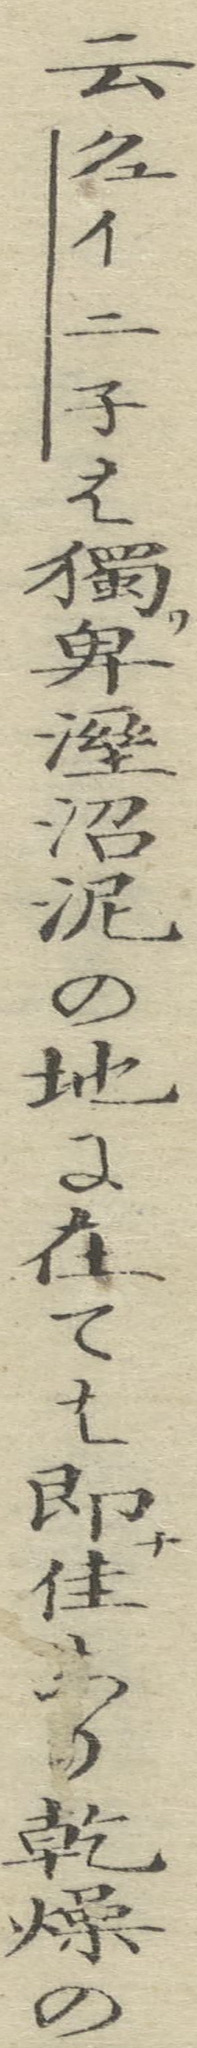云クュイニネは獨卑溼沼泥の地に在ては即佳なり乾燥の
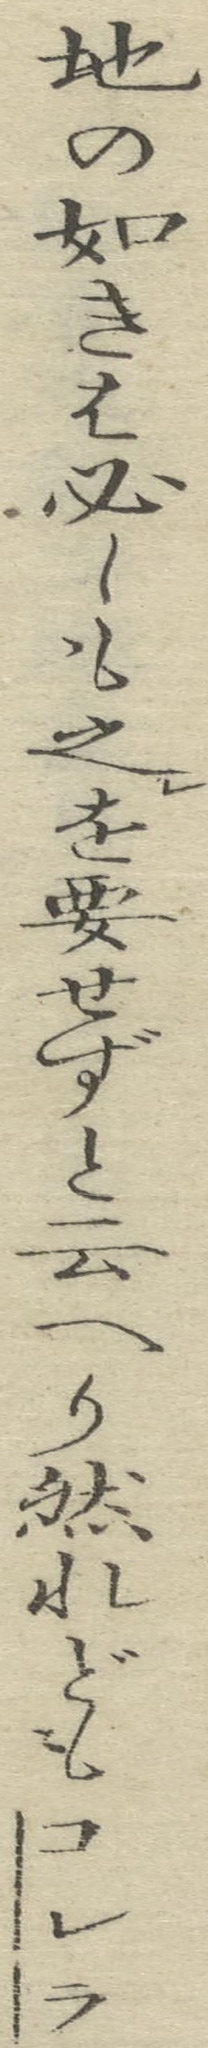地の如きは必し之要せずと云へり然れどもコレラ
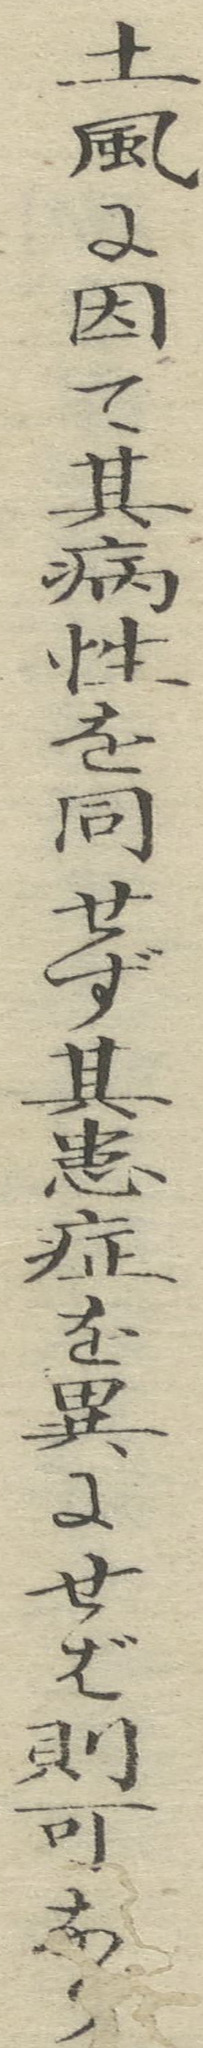土風に因て其病性を同せず其患症を異にせば則可なり
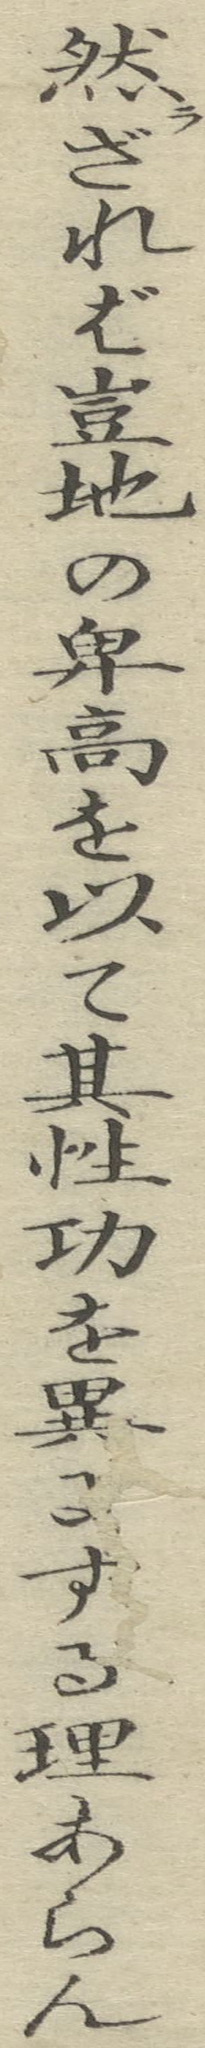然豈地の卑高を以て其性功を異にする理あらん
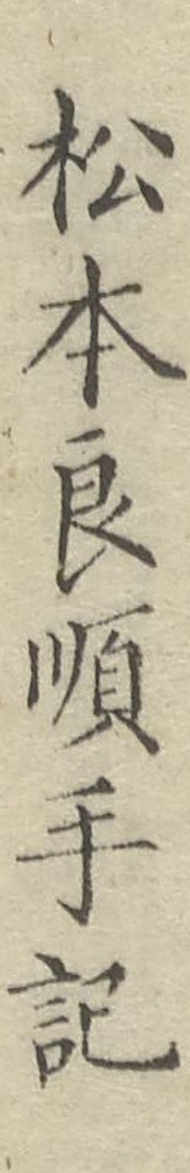松本良順記
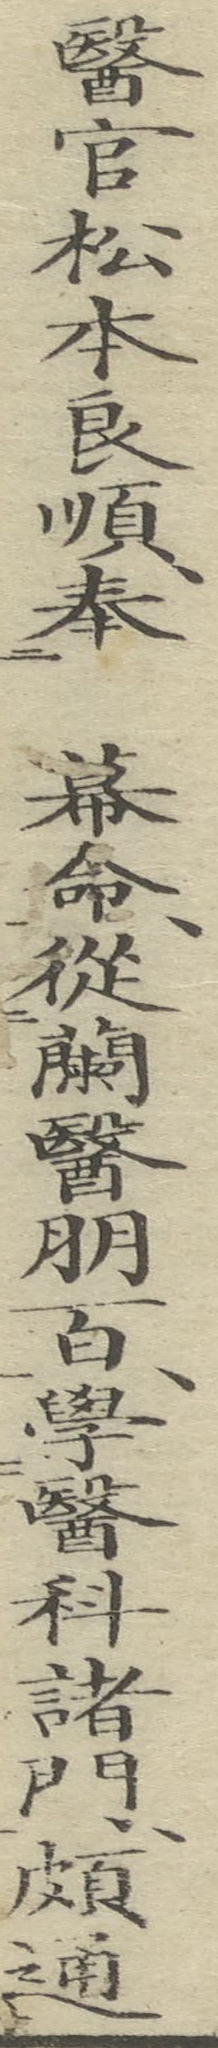醫官松本良順、奉幕命、蘭醫朋百、學醫科諸門広、頗通

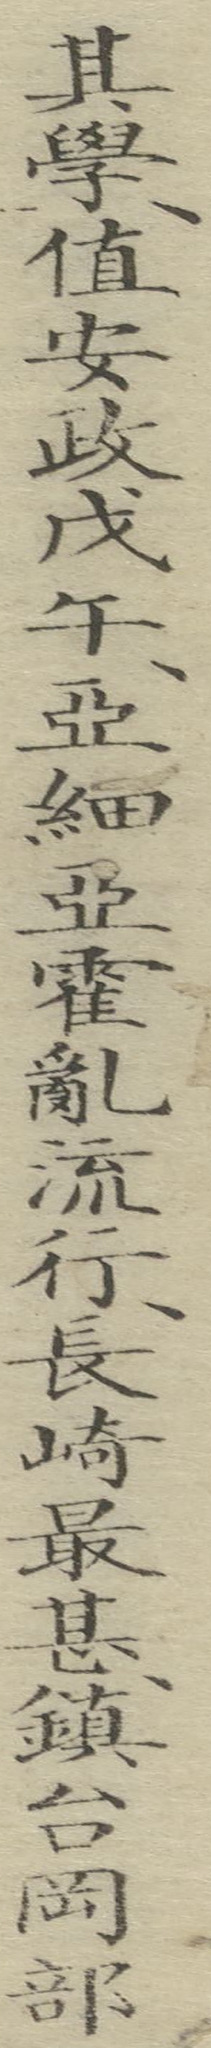其學、値安政戌午、亞細亞霍亂流行、長崎最甚、鎮台岡部
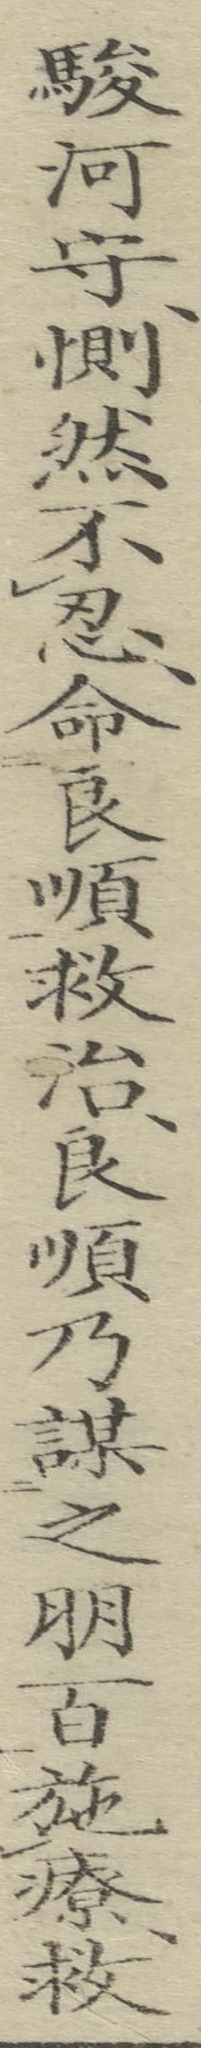駿河守、惻然不忍、命良順救治、良順乃謀之朋百施療、救
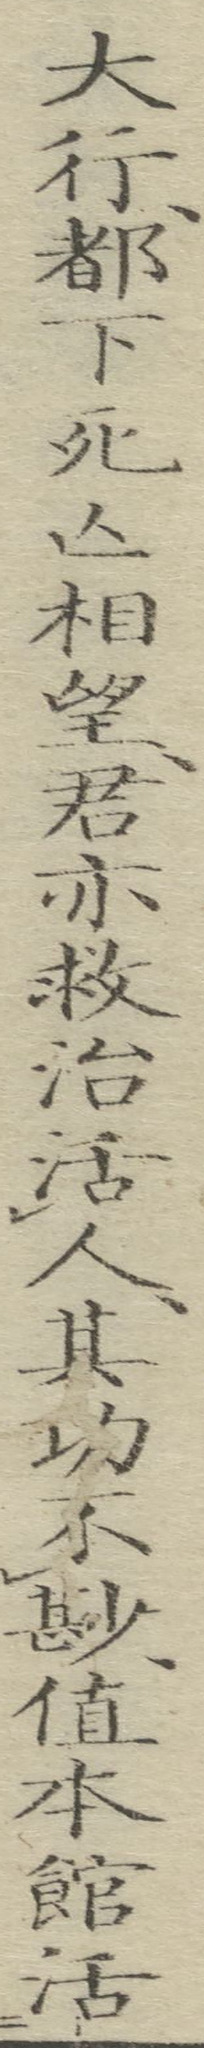大行、都下死𠤭相望、君亦救治活人、其功不尠、値本館活
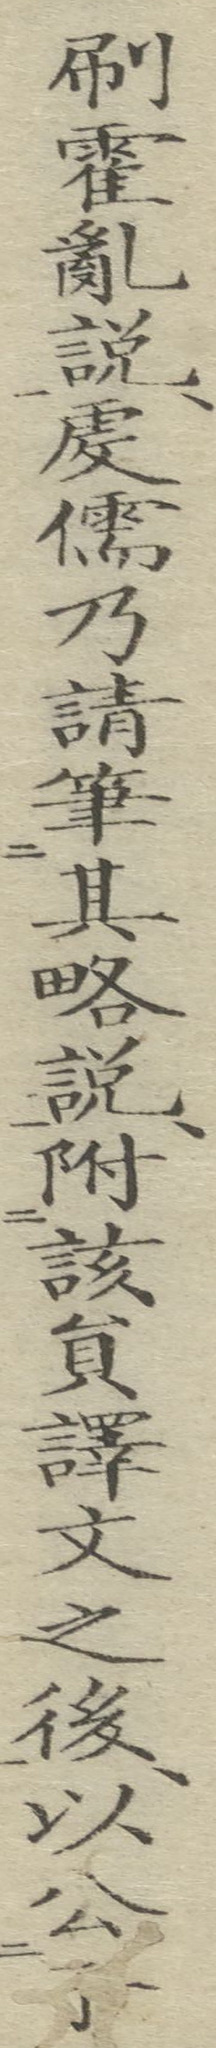刷霍乱説、儒乃請筆其略説、附該譯文之後、以公子
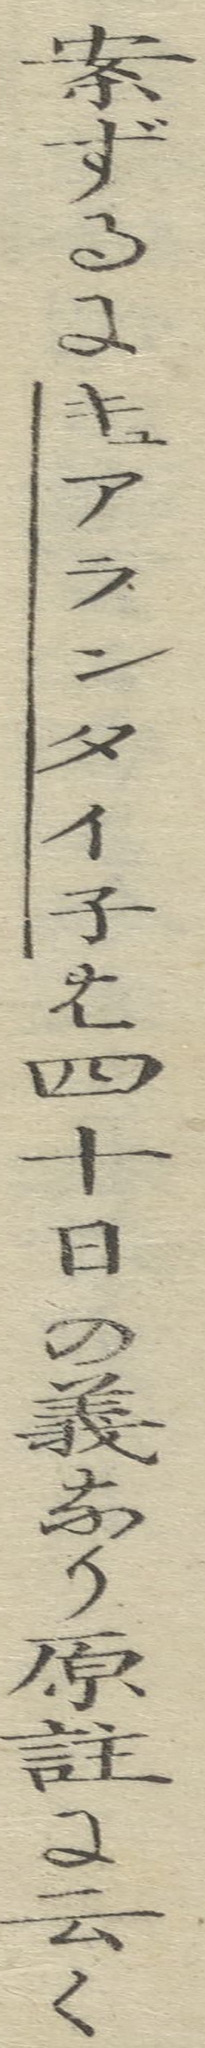案ずるにキュランタイニは四十日の義なり原註に云く
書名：官版疫毒預防説　全
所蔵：東京大学総合図書館 General Library in the University of Tokyo, JAPAN
